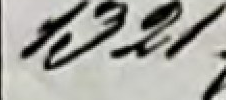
1321
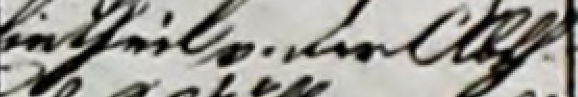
Ein Theil v. der Abth.
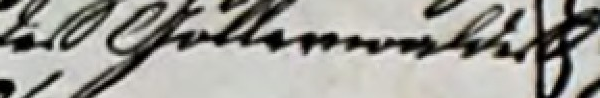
des Göllerwalder
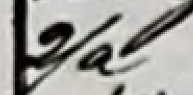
2/a
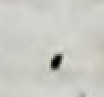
„
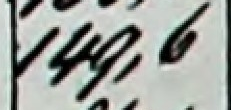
149,6
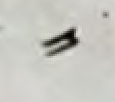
„
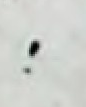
„
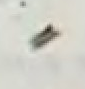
„
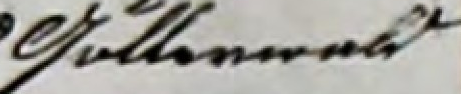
Göllerwald
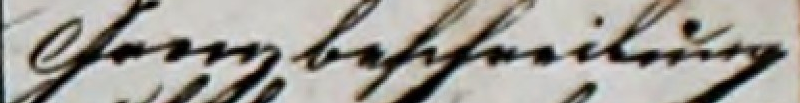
Grenzbeschreibung
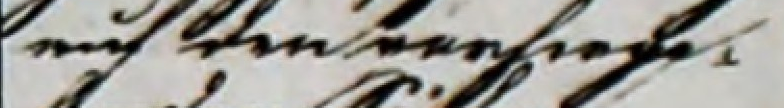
auf den vorherge„
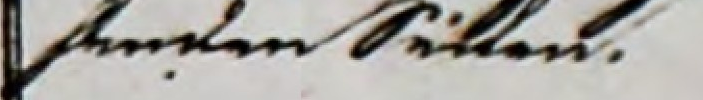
henden Seiten.
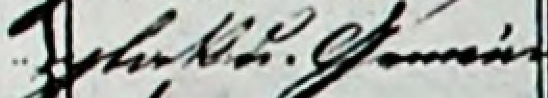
platt u. Gemein„
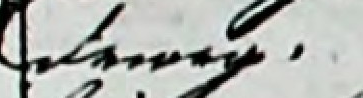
deweg.
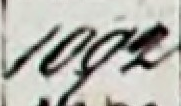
1092
